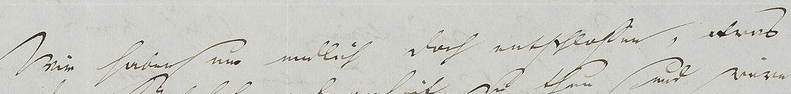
Wir haben uns endlich doch entschlossen, etwas
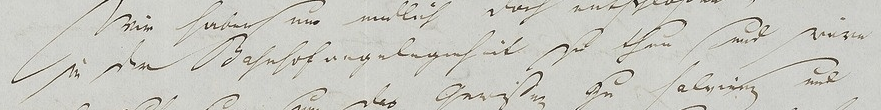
in der Bahnhofangelegenheit zu thun und wäre
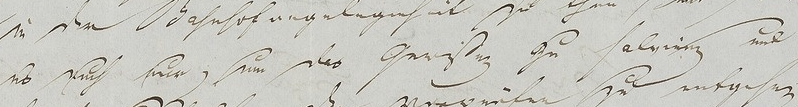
es auch nur, um das Gewissen zu salviren und
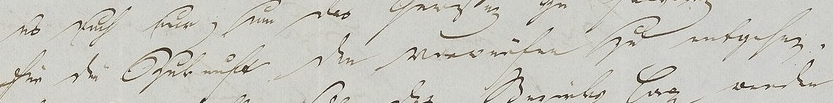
für die Zukunft den Vorwürfen zu entgehen.
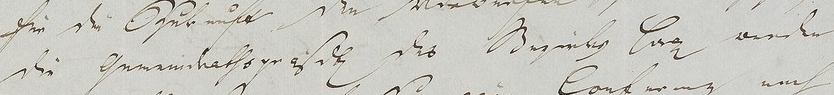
Die Gemeindrathspräsdtn des Bezirks Horgen werden
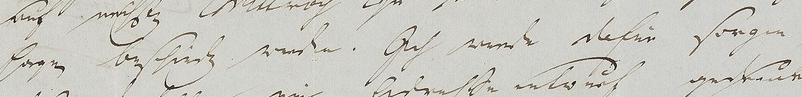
Horgen beschieden werden. Ich werde dafür sorgen,
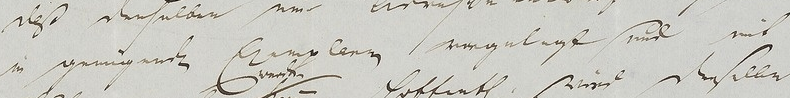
in genügenden Exemplaren vorgelegt und mit
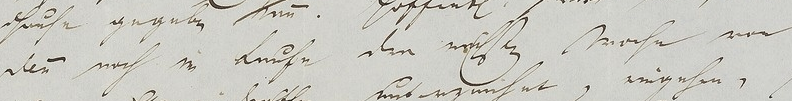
dann noch im Laufe der nächsten Woche von
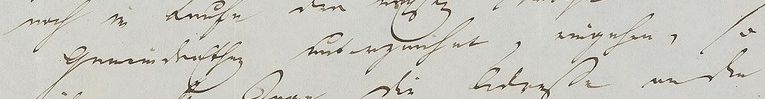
Gemeindräthen unterzeichnet, eingehen, so
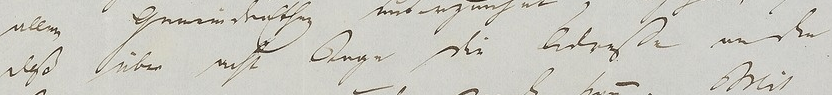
daß über acht Tage die Adresse an den
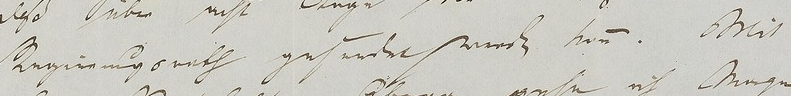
Regierungsrath gesendet werden kann. Mit
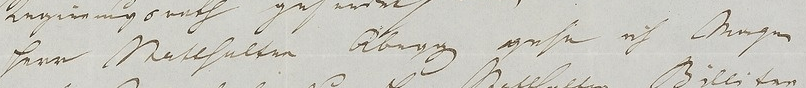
Herr Statthalter Abegg gehe ich Morgen
